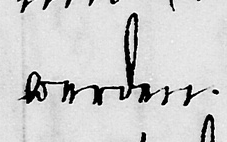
werden.
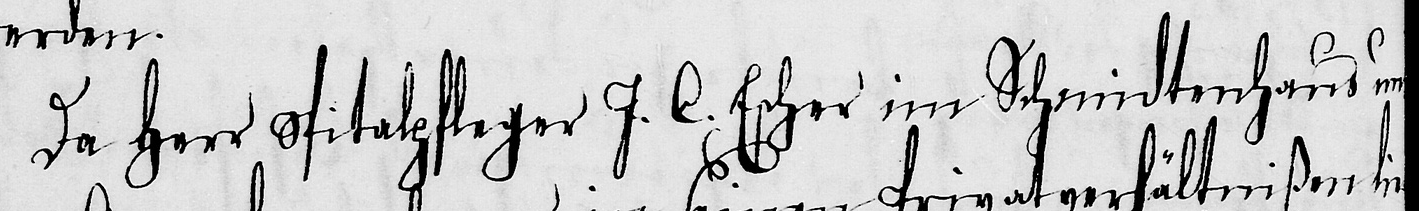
Da Herr Spitalpfleger J. C. Escher im Schmidtenhaus u¬
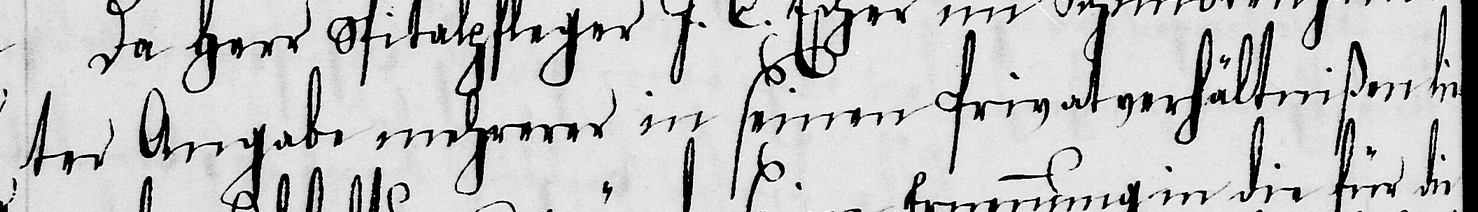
nter Angabe mehrerer in seinen Privatverhältnißen li¬
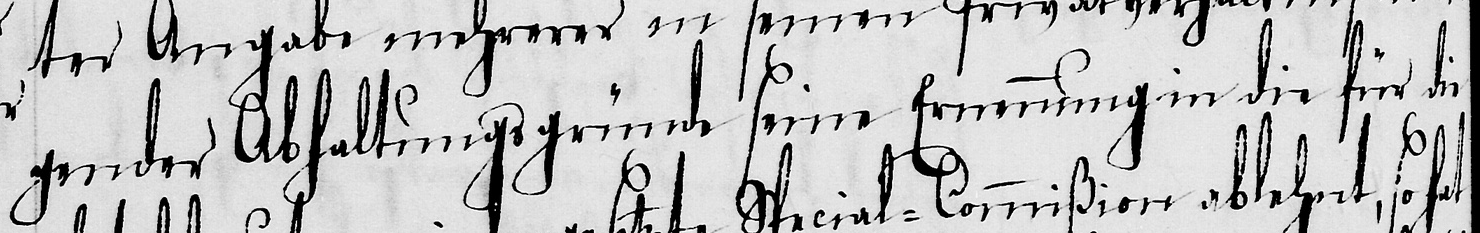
egender Abhaltungsgründe seine Ernennung in die für d¬
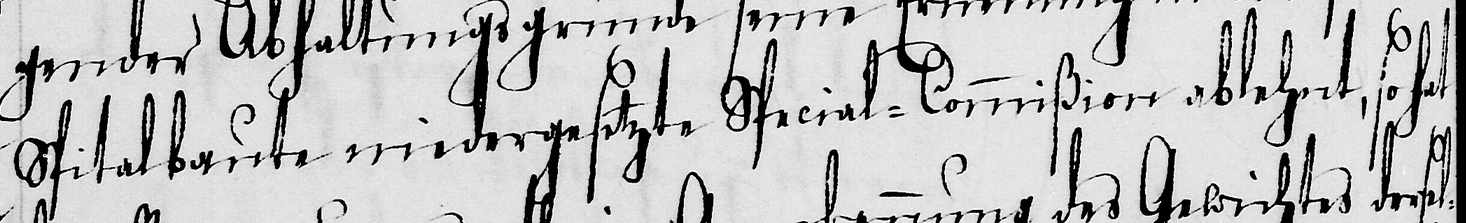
Spitalbaute niedergesetzte Special-Commißion ablehnt, so
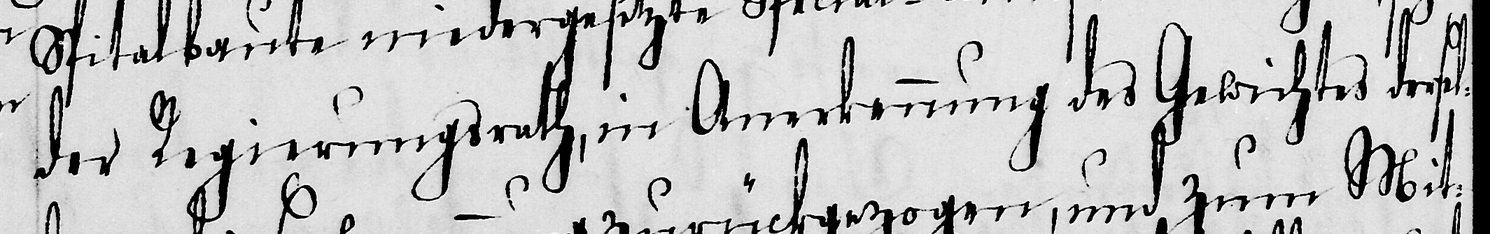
der Regierungsrath, in Anerkennung des Gewichtes ders¬
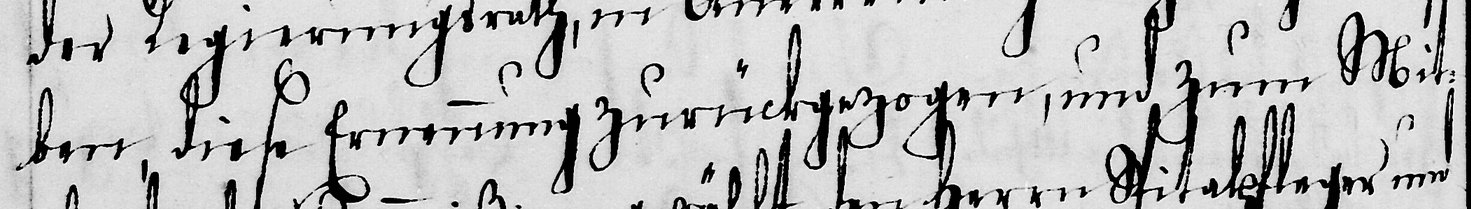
ben, diese Ernennung zurückgezogen, und zum Mit¬
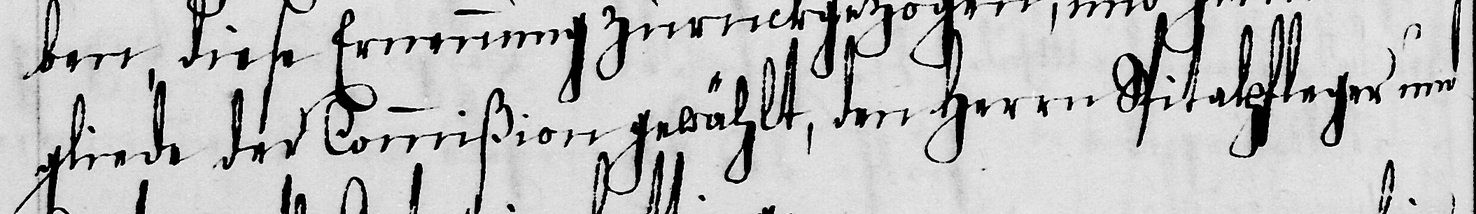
gliede der Commißion gewählt, den Herrn Spitalpfleger u¬
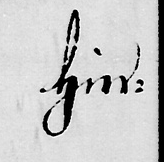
hier¬
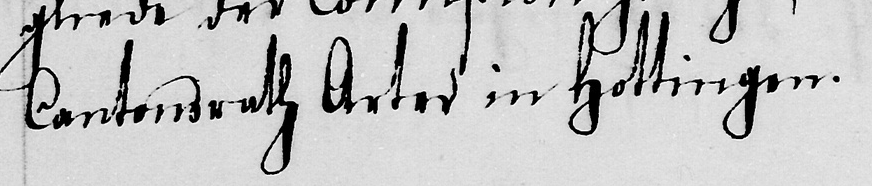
Cantonsrath Artur in Hottingen.
